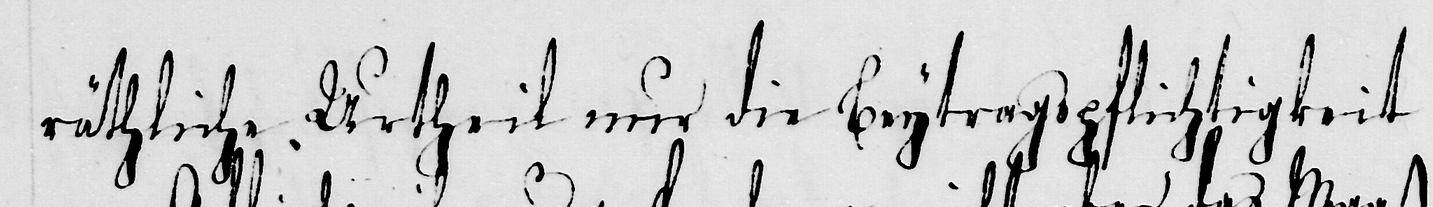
räthliche Urtheil nur die Beytragspflichtigkeit
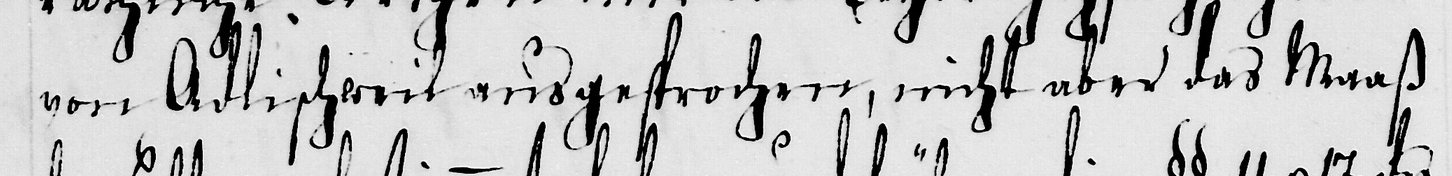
von Adlischweil ausgesprochen, nicht aber das Maaß
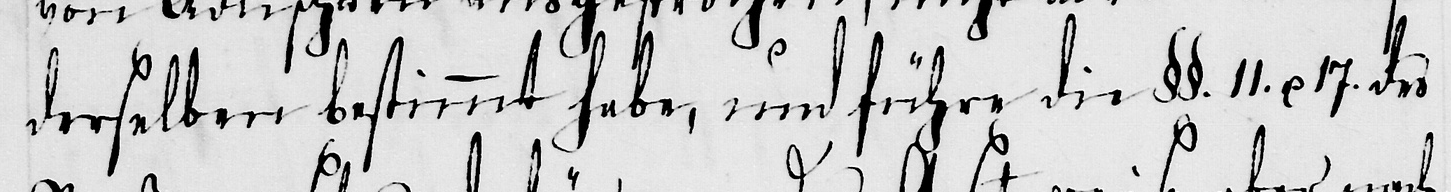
derselben bestimmt habe, und führe die §§. 11. u.
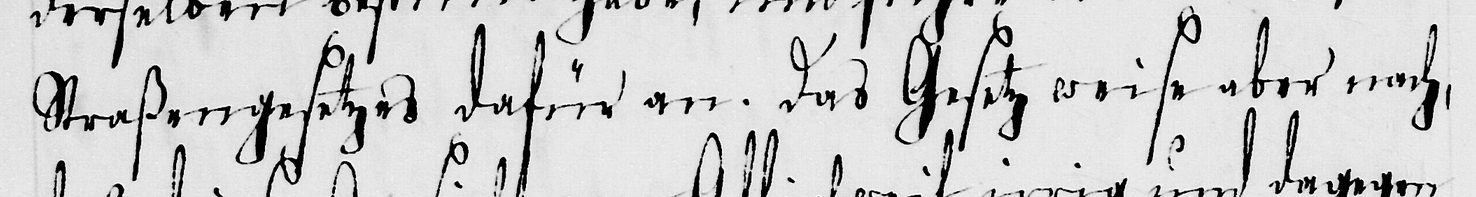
Straßengesetzes dafür an. Das Gesetz weise aber nach,
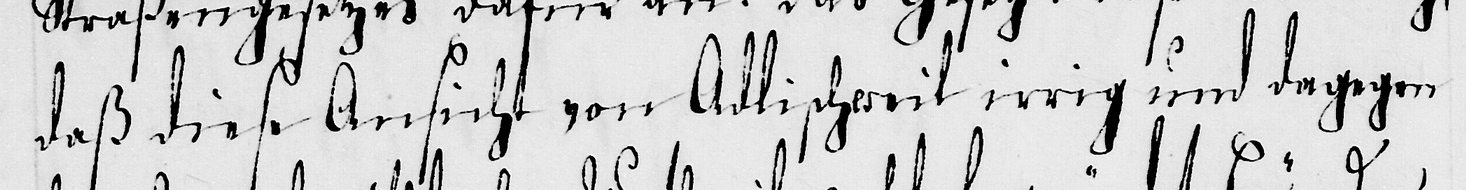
daß diese Ansicht von Adlischweil irrig und dagegen
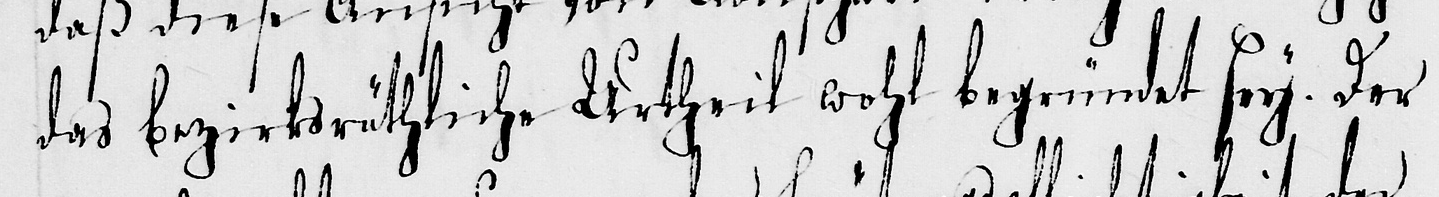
das bezirksräthliche Urtheil wohl begründet sey. Der
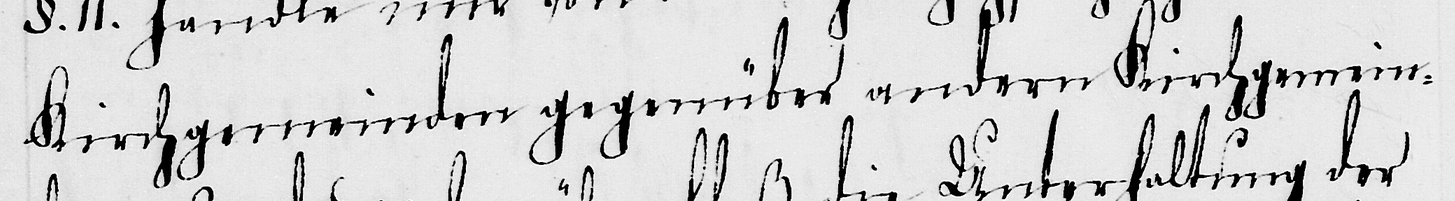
Kirchgemeinden gegenüber andern Kirchgemein¬
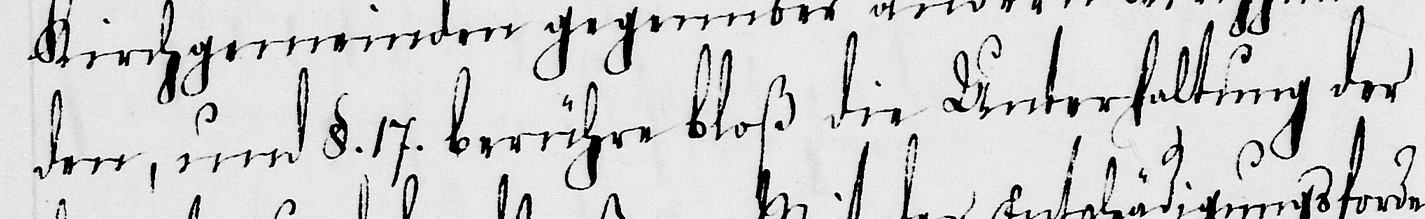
den, und §. 17. berühre bloß die Unterhaltung der
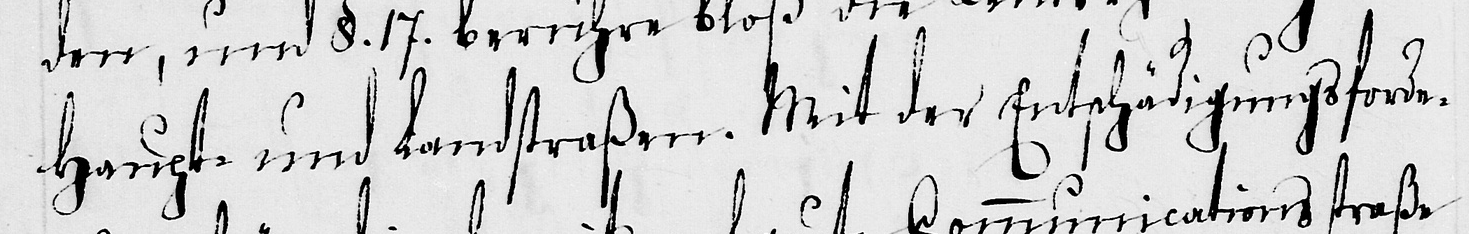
Haupt- und Landstraßen. Mit der Entschädigungsforde¬
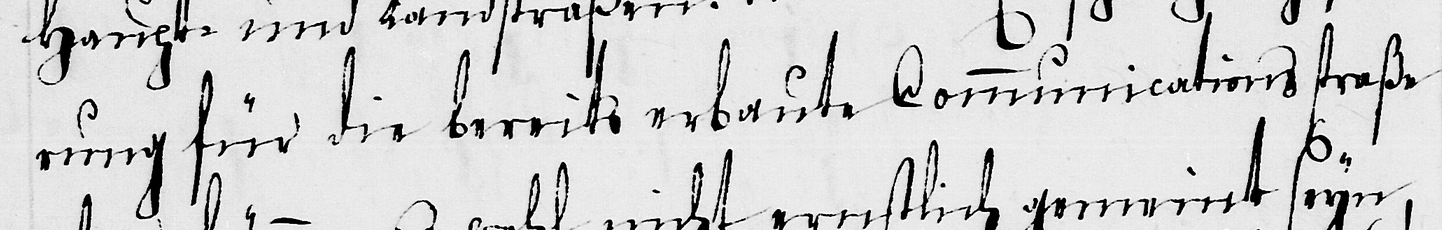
rung für die bereits erbaute Communicationsstraße
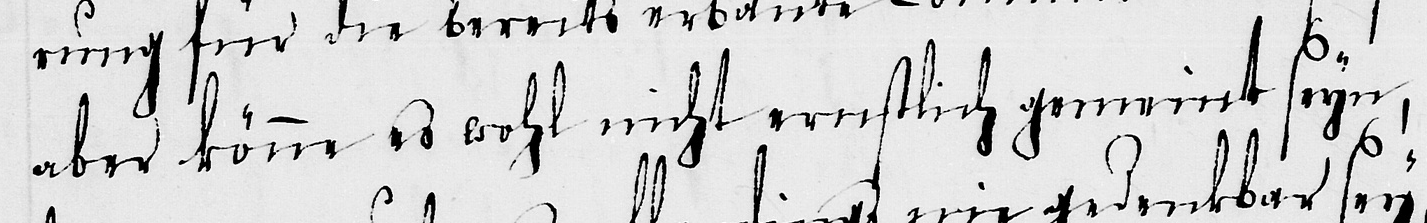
aber könne es wohl nicht ernstlich gemeint seyn,
